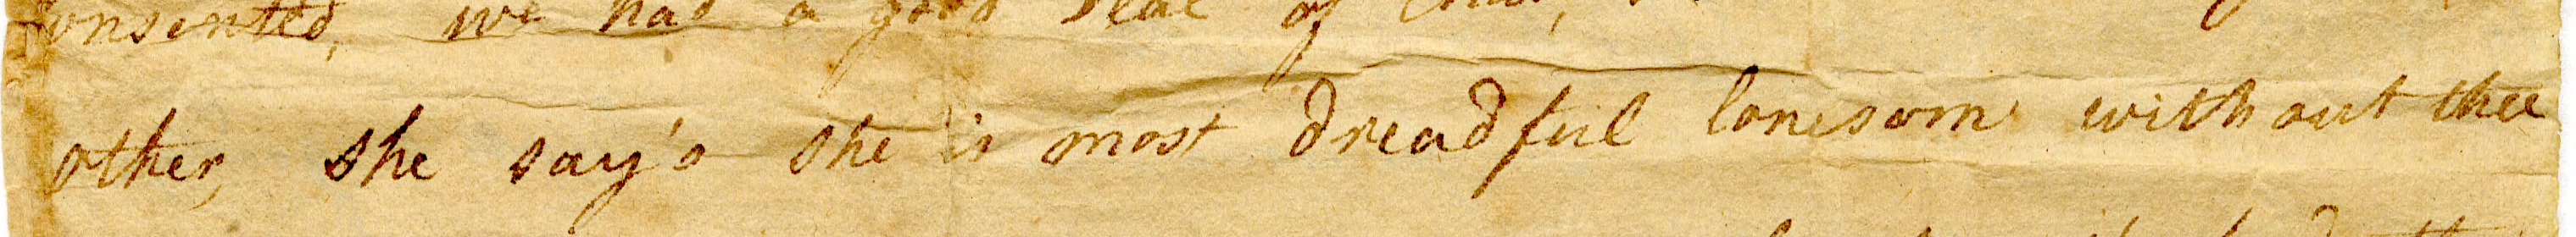other she say's she is most dreadful lonesome with out thee
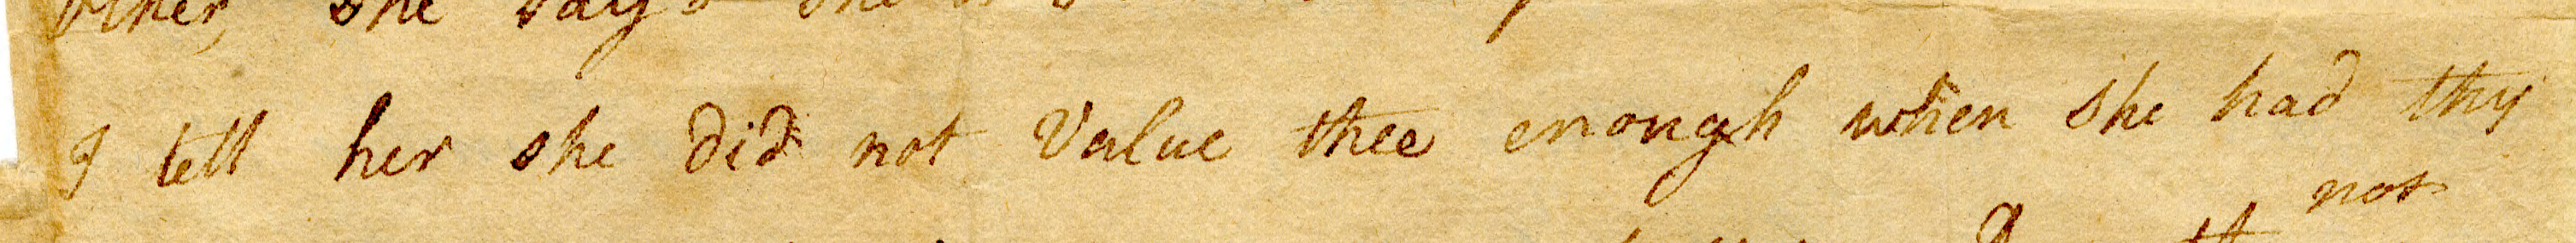I tell her she did not value thee enough when she had thy
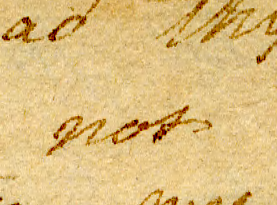not
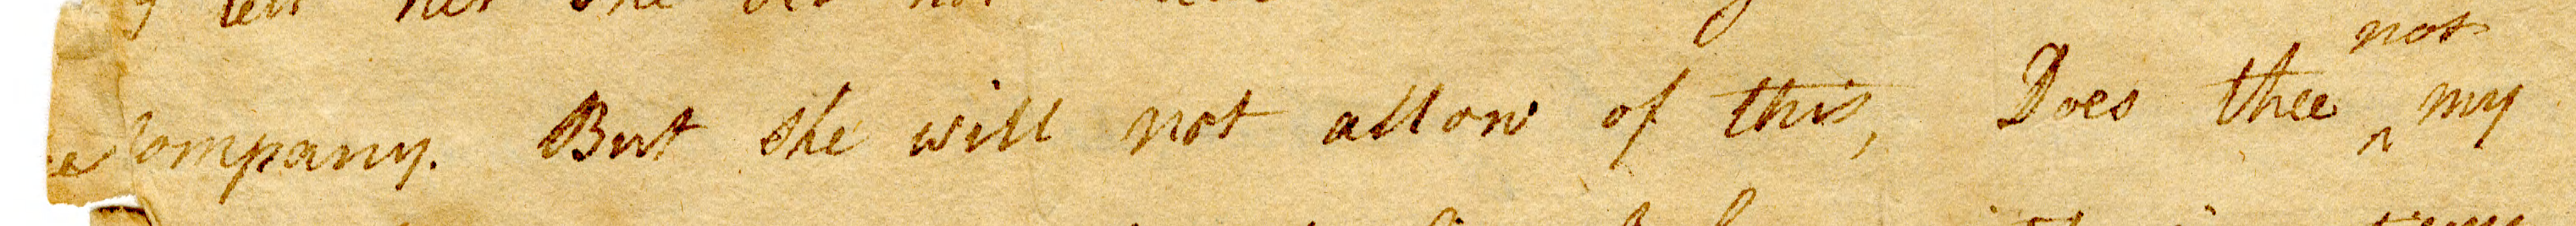Company. But she will not allow of this, Does thee ^ my
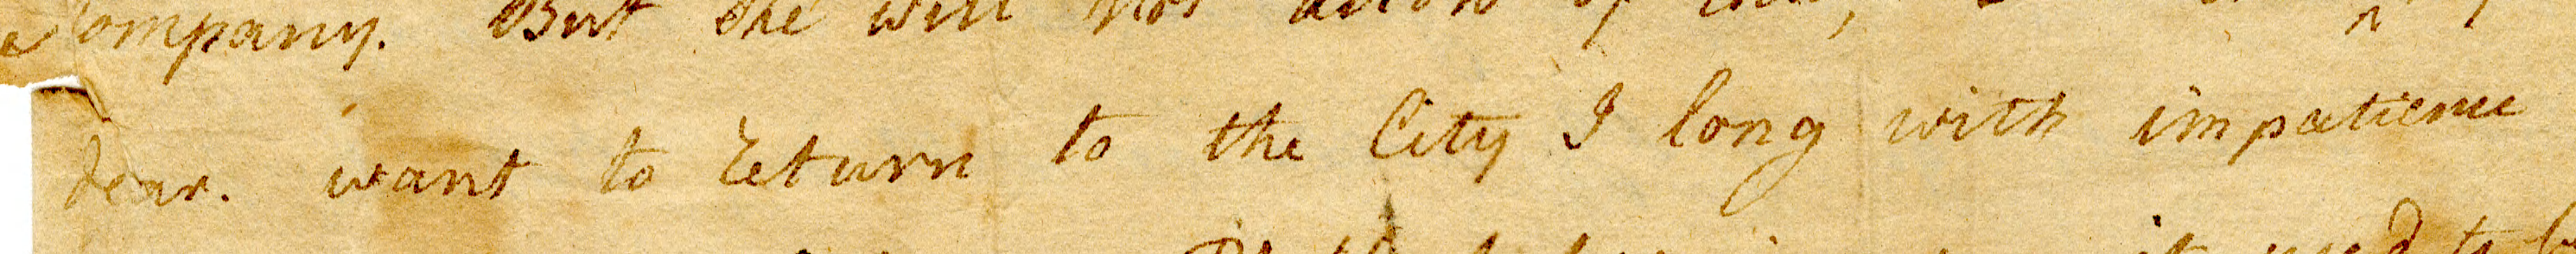dear want to return to the City I long with impatience
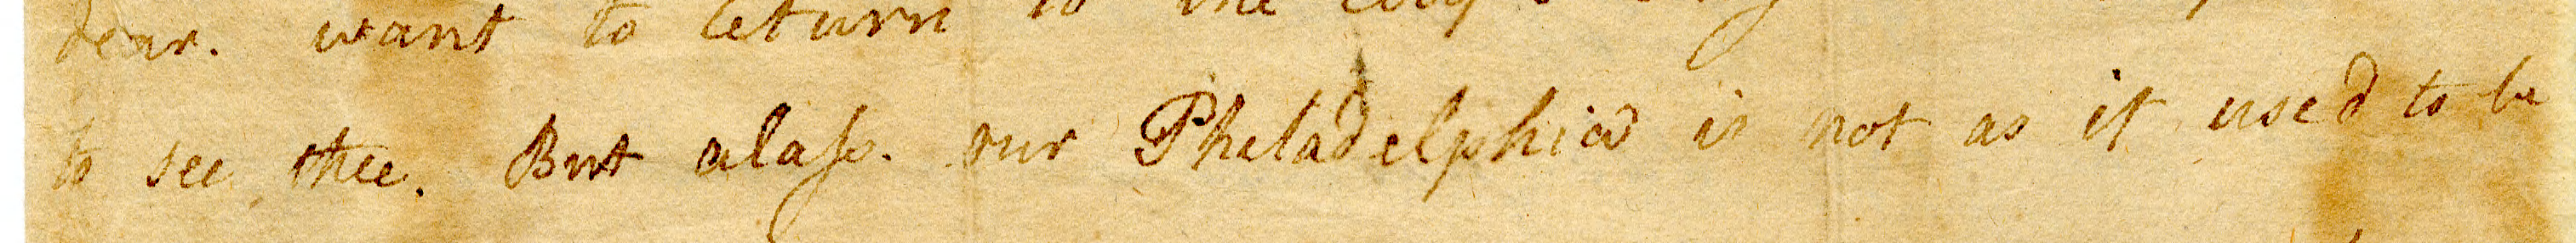to see thee. But alas our Philadelphia is not as it used to be
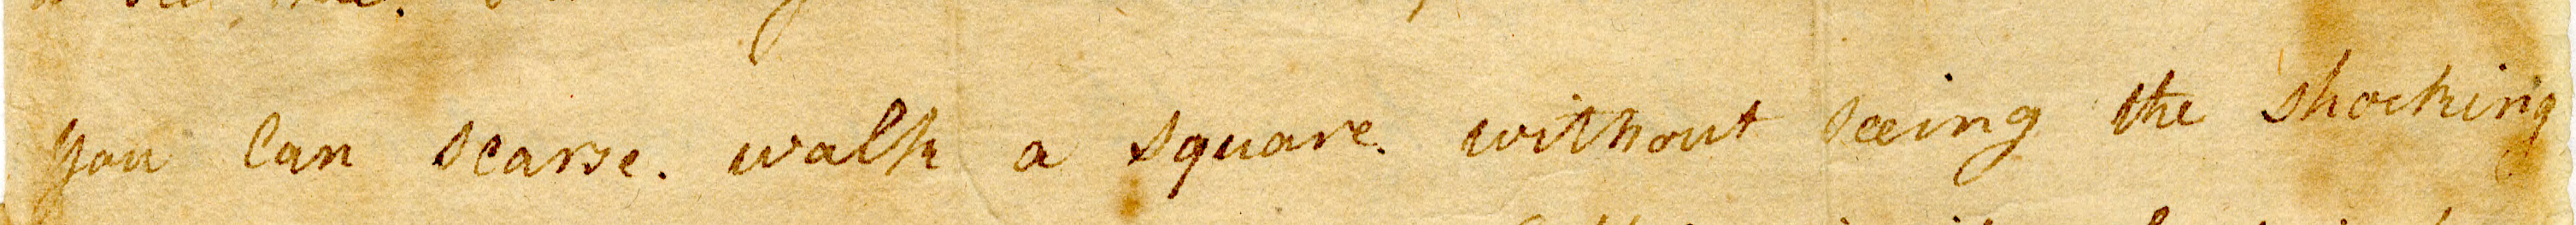you can scarse. walk a square without seeing the shocking
